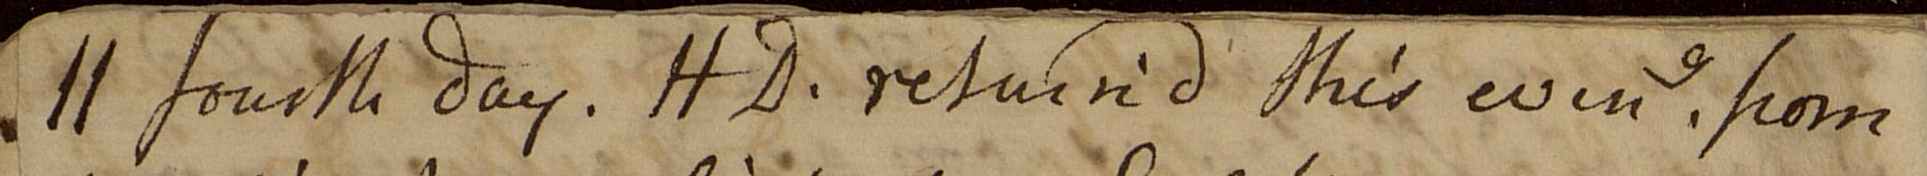11 fourth day. HD: return'd this even^g. from
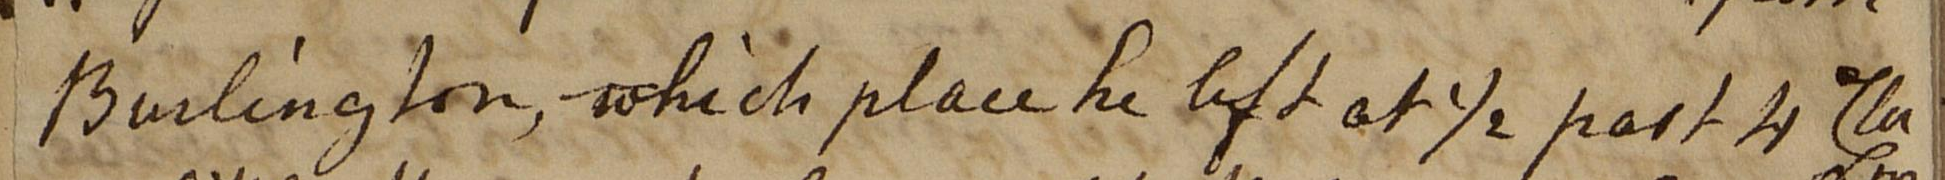Burlington, which place he left at 1/2 past 4 Clu
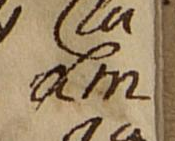am
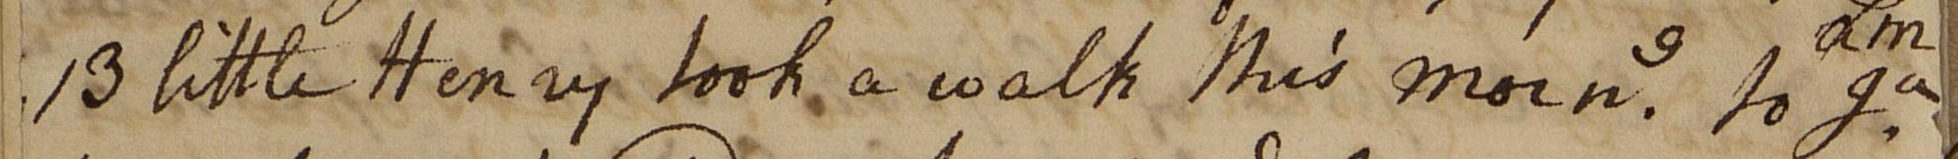13 little Henry took a walk this morn^g to J^a.
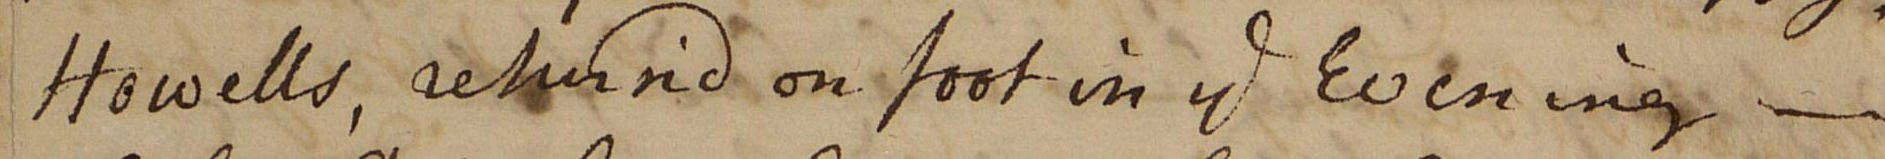Howells, return'd on foot in y^e Evening-
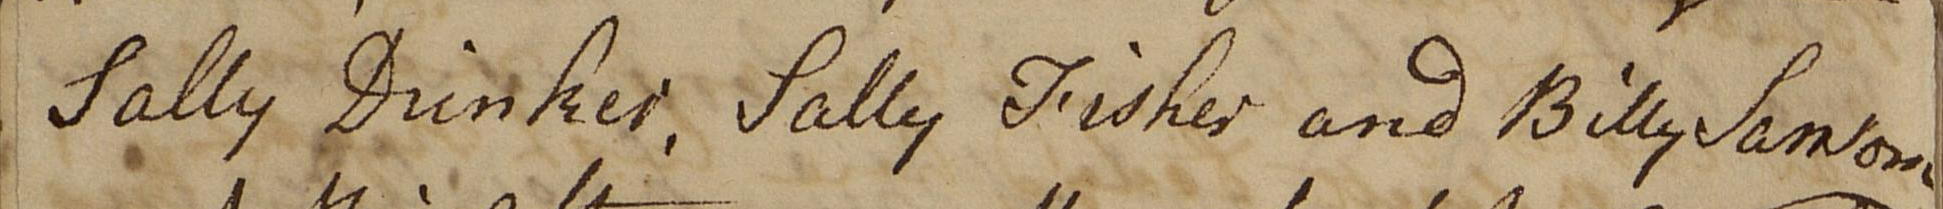Sally Drinker, Sally Fisher and Billy Sansom
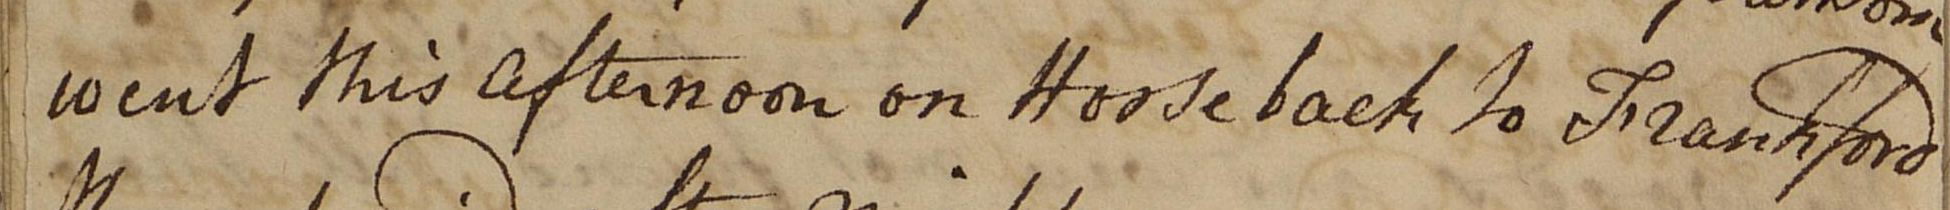went this Afternoon on Horse back to Frankford
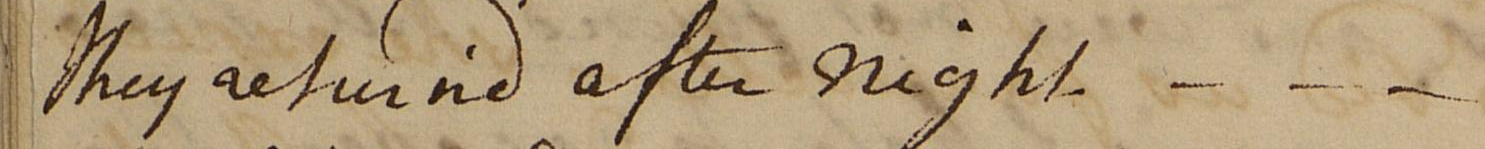they return'd after Night---
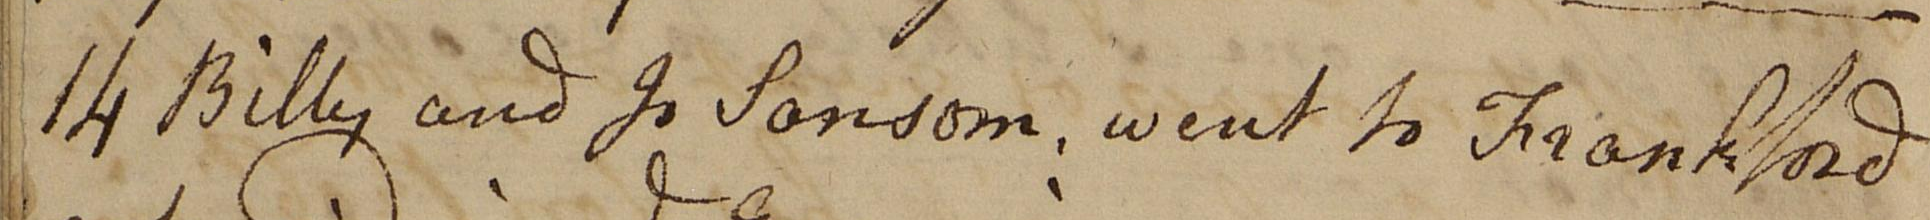14 Billy and Jo Sansom, went to Frankford
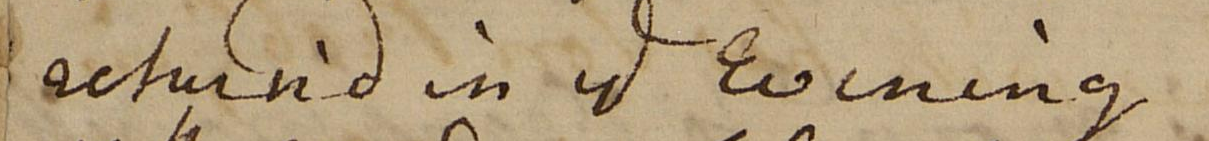return'd in y^e Evening
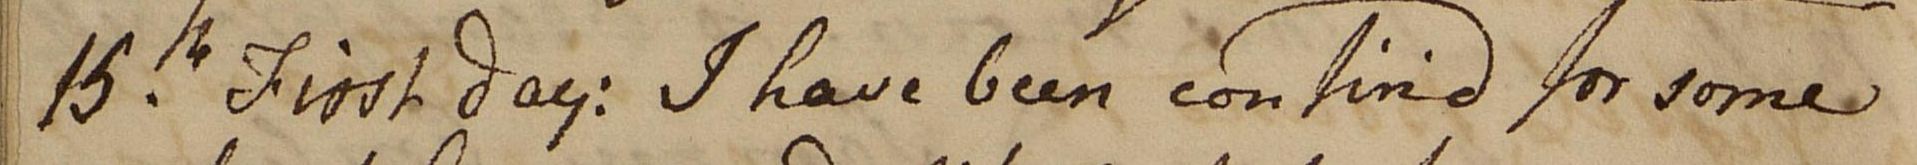15^th. First day: I have been confin'd for some
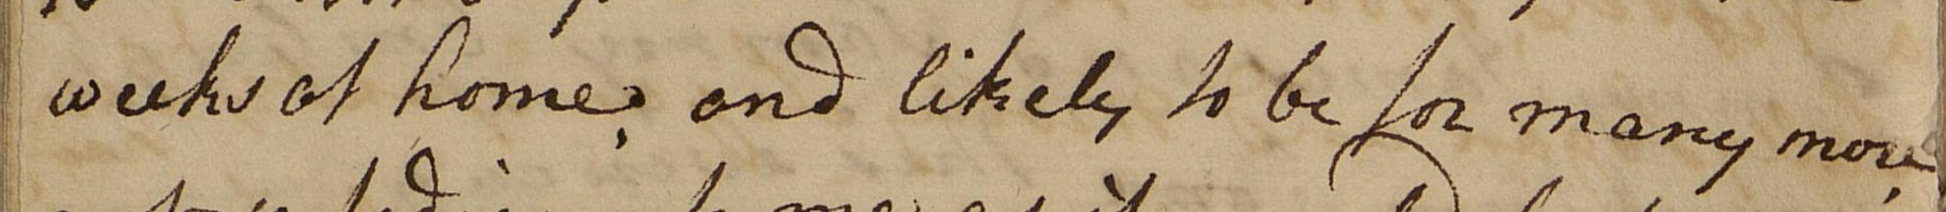weeks at home and likely to be for many more
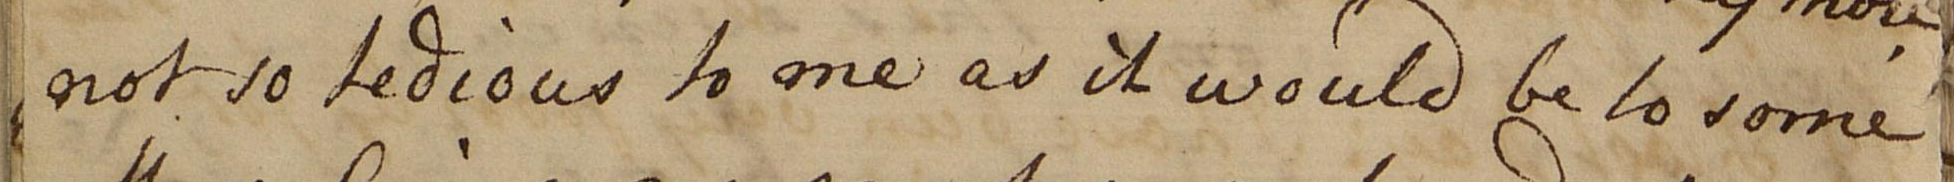not so tedious to me as it would be to some
